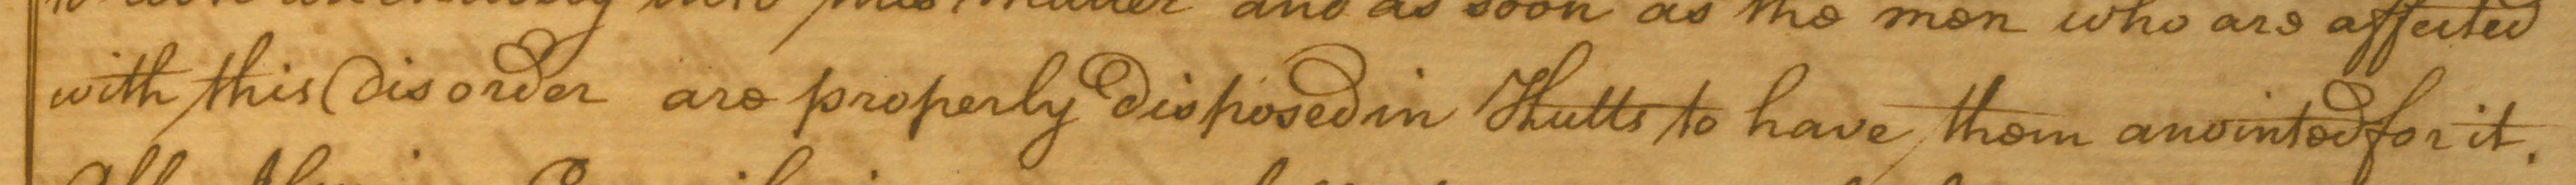with this disorder are properly disposed in Hutts to have them anointed for it.
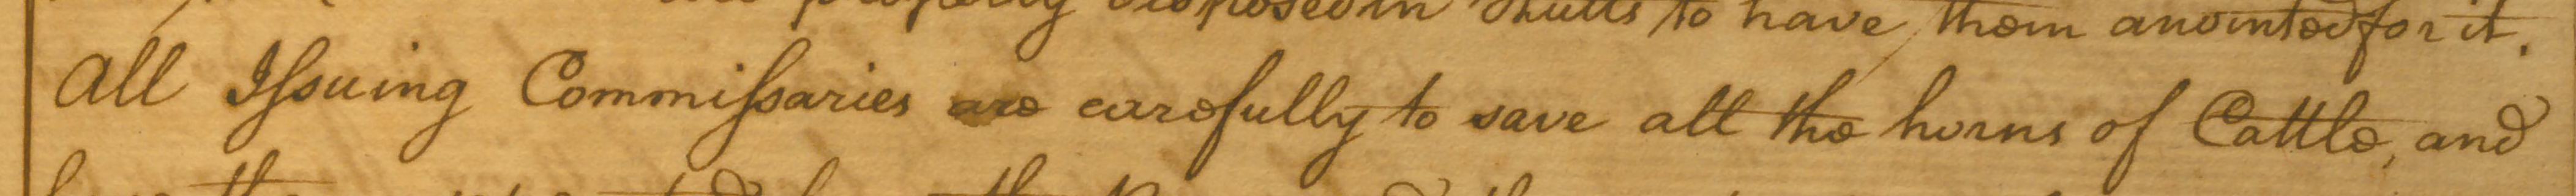All Issuing Commissaries are carefully to save all the horns of Cattle and
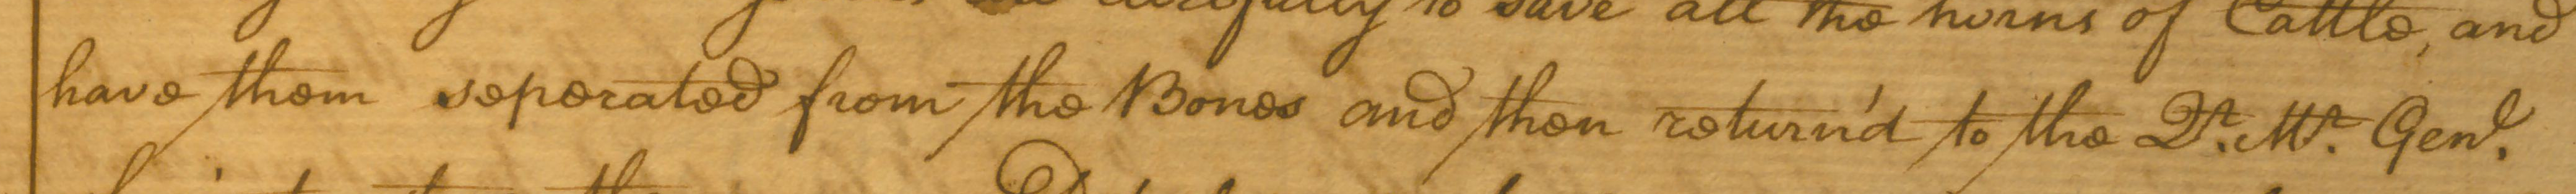have them separated from the Bones and then return'd to the Q^r. M^r. Gen^l.
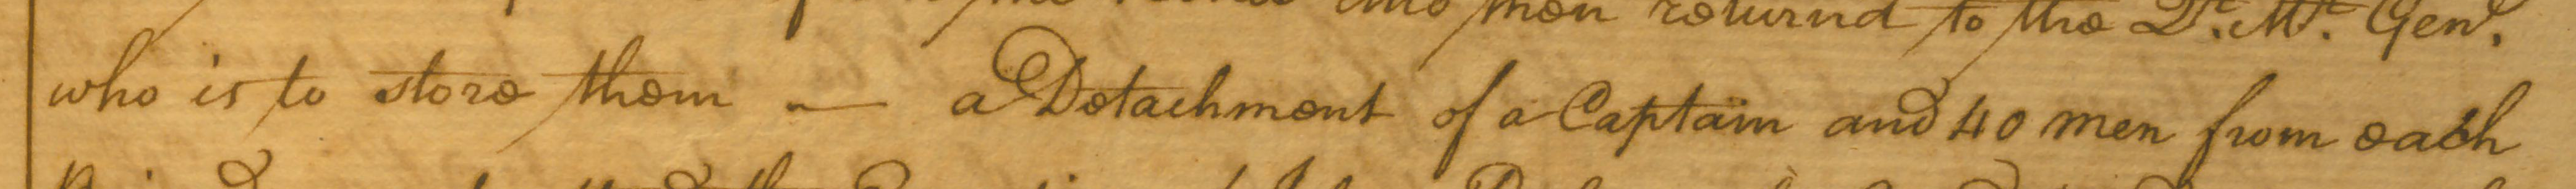who is to store them- a Detachment of a Captain and 40 men from each
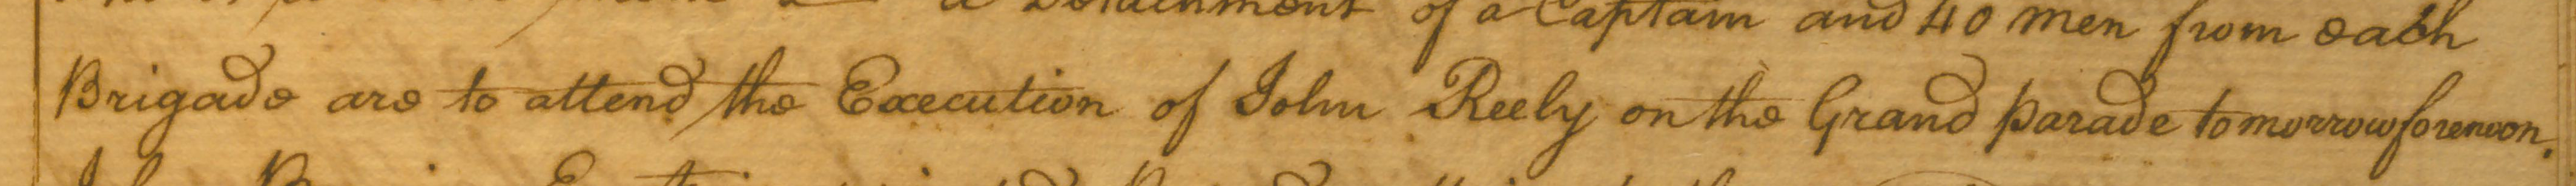Brigade are to attend the Execution of John Reely on the Grand parade tomorrow forenoon,
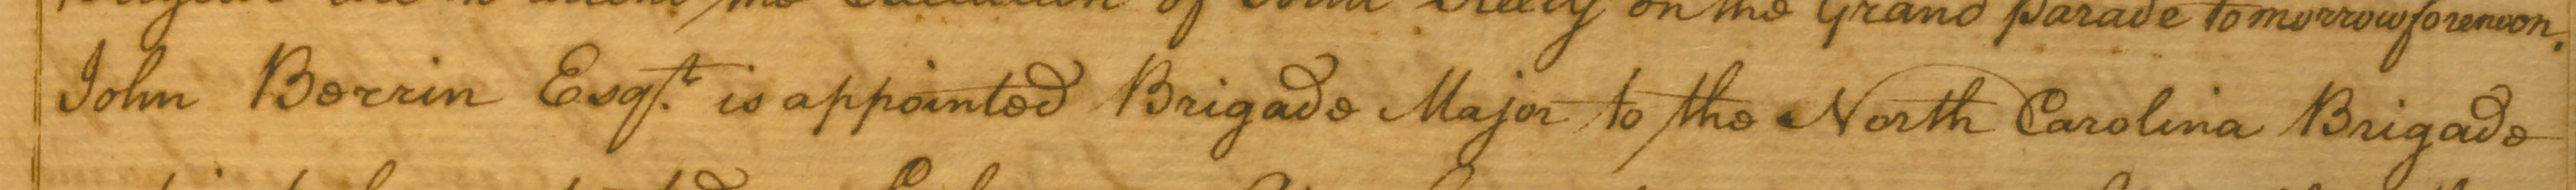John Berrin Esq^r. is appointed Brigade Major to the North Carolina Brigade
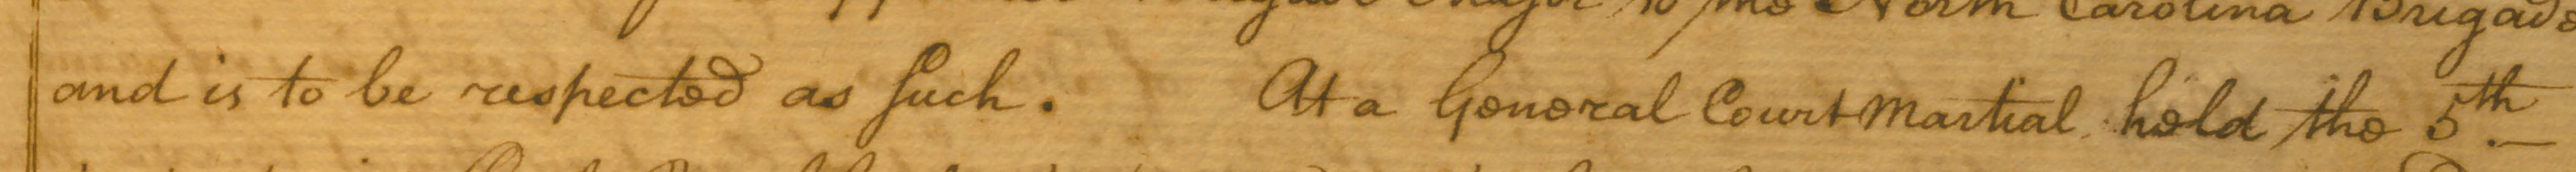and is to be respected as such. At a General Court martial held the 5^th.
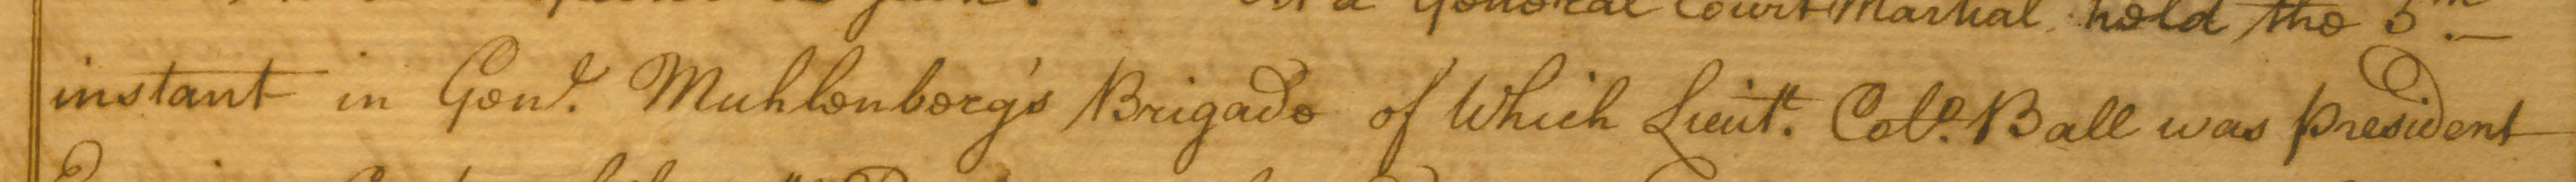instant in Gen^l. Muhlenberg's Brigade of Which Lieut^t. Col^o. Ball was president
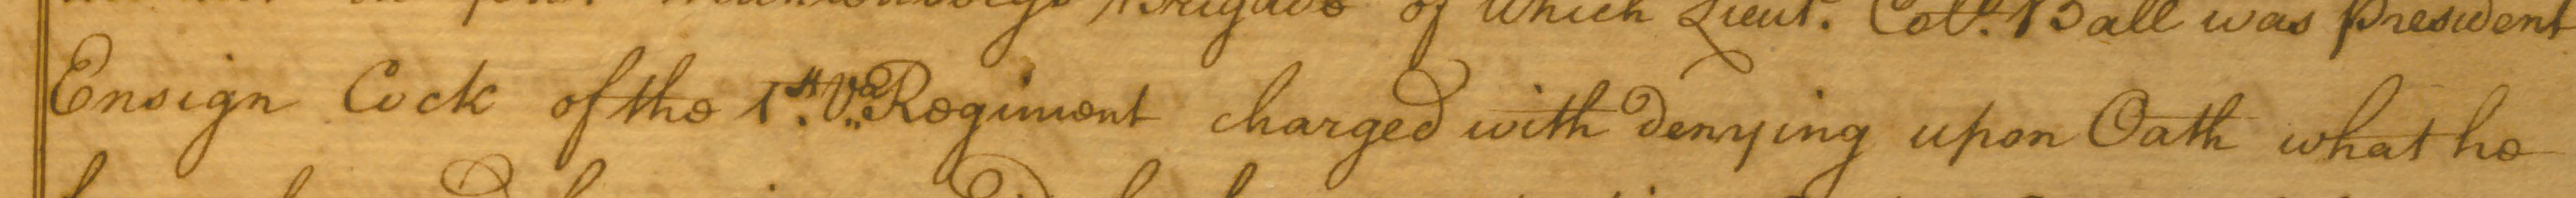Ensign Cock of the 1^st. V^a. Regiment charged with denying upon Oath what he
